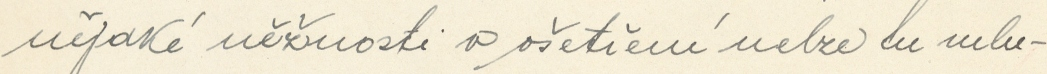nějaké něžnosti v ošetření nelze tu mlu-
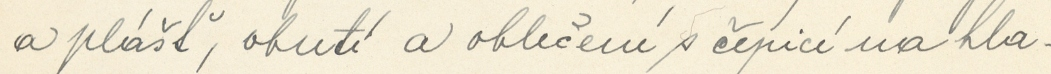a plášť, obutí a oblečení s čepicí na hla-
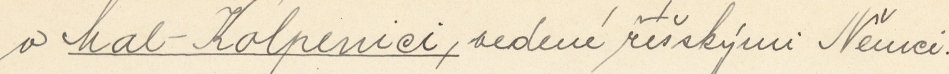v Mal-Kolpenici, vedené říšskými Němci.
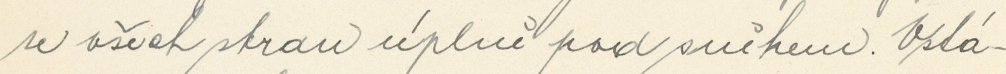se všech stran úplně pod sněhem. Vstá-
